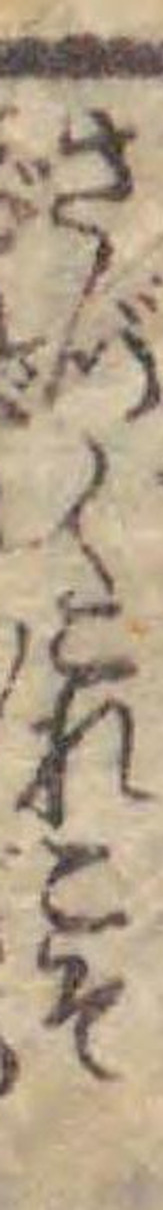さづくこれこそ
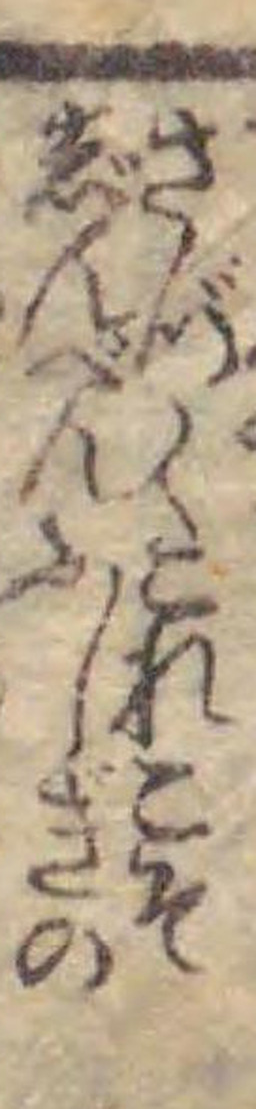じんべんふしぎの
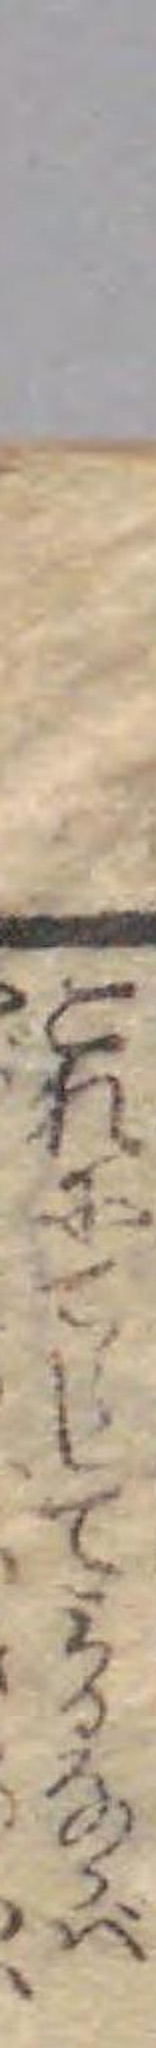これにてらしてみるならば
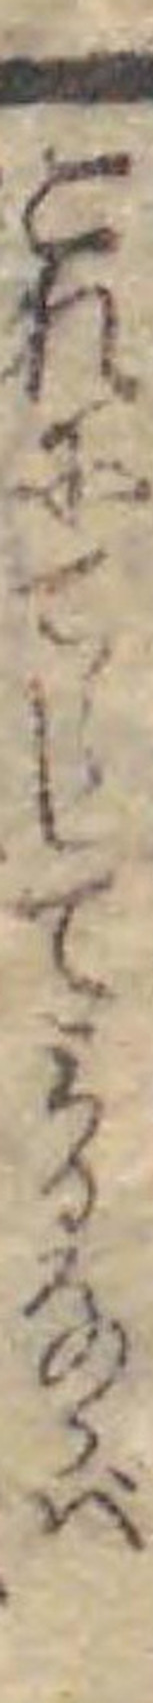これにてらしてみるならば
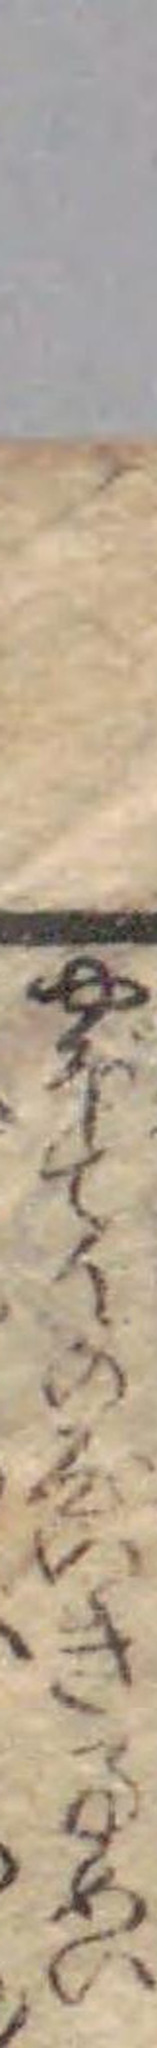やぼてんのひいき事めい
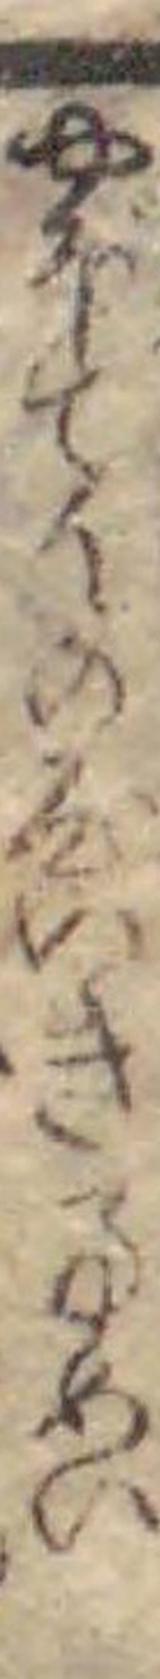やぼてんのひいき事めい
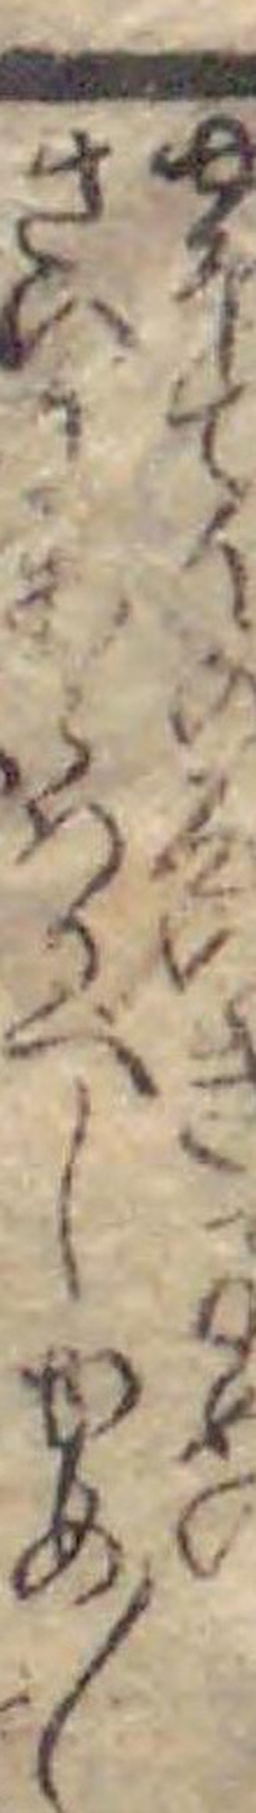さいにあらはるべしやあ〳〵
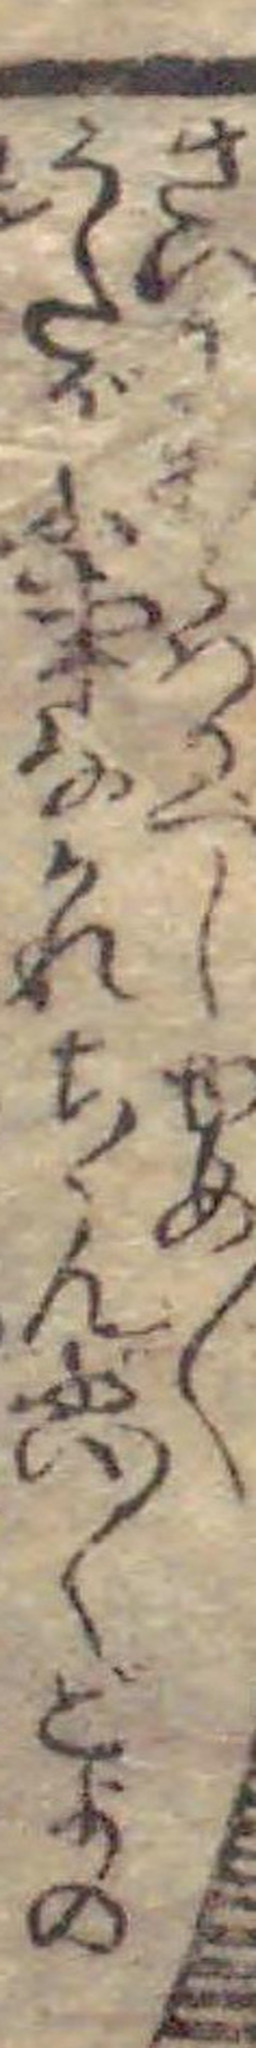うたがふ事なかれちゝんぷい〳〵どよの
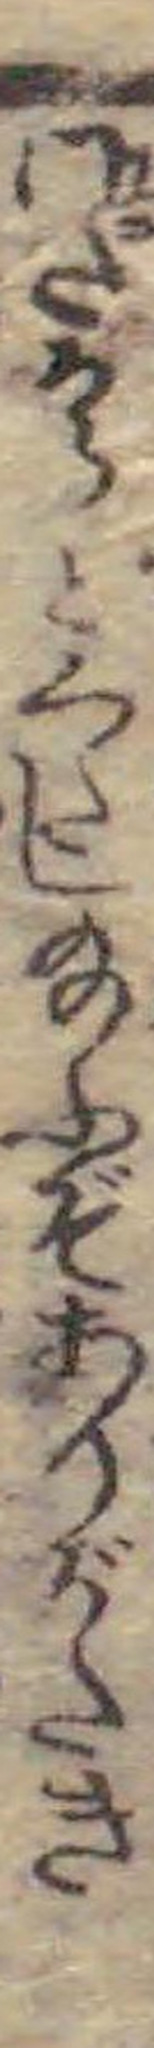御ンたからとくたし給ふぞありがたき
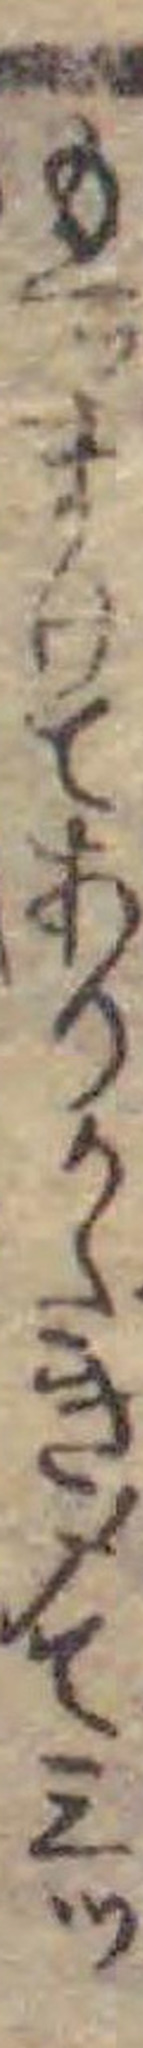も一ッまけてありかたき〆て三ッ
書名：人間一心覗替繰 : 2巻
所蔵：国立国会図書館 National Diet Library, JAPAN
